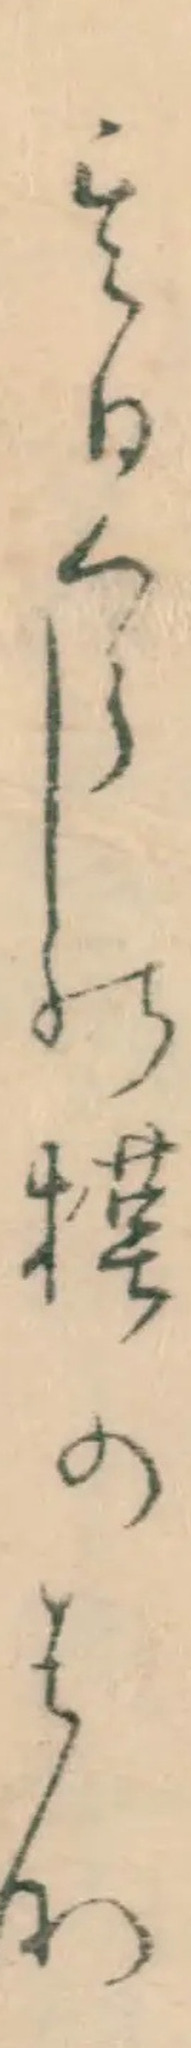其日くらしの樺のはな青牛
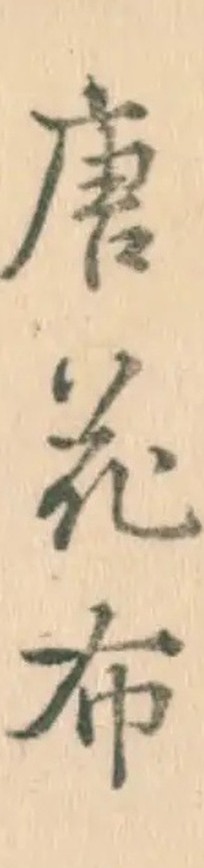唐花布

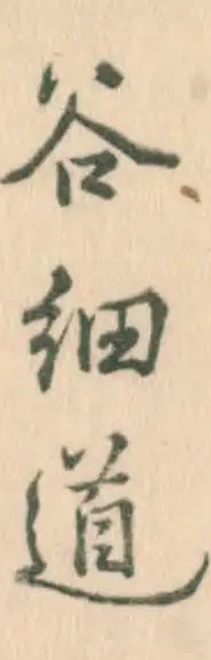谷細道
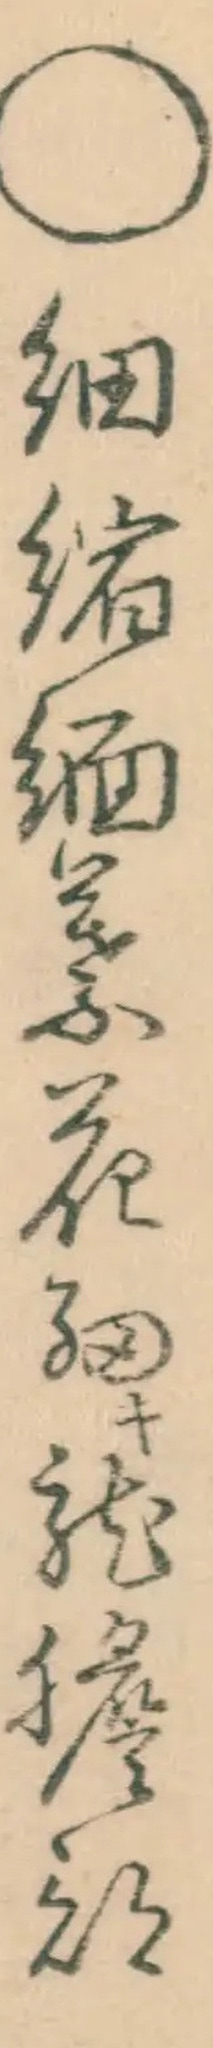○細縮緬葉花細き龍膽部
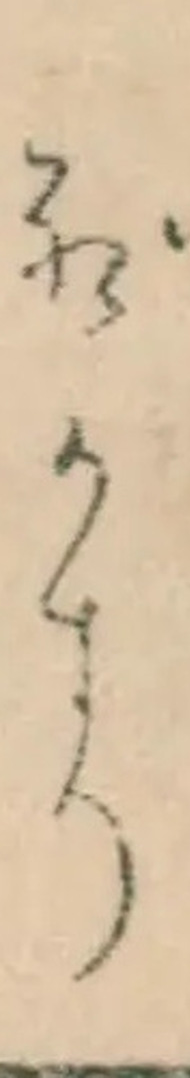紅かすり
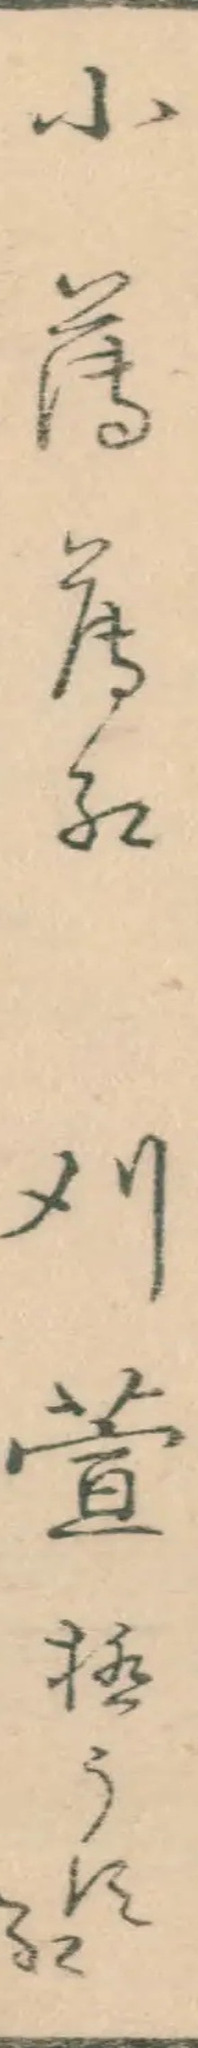小薄薄紅刈萱極うす紅
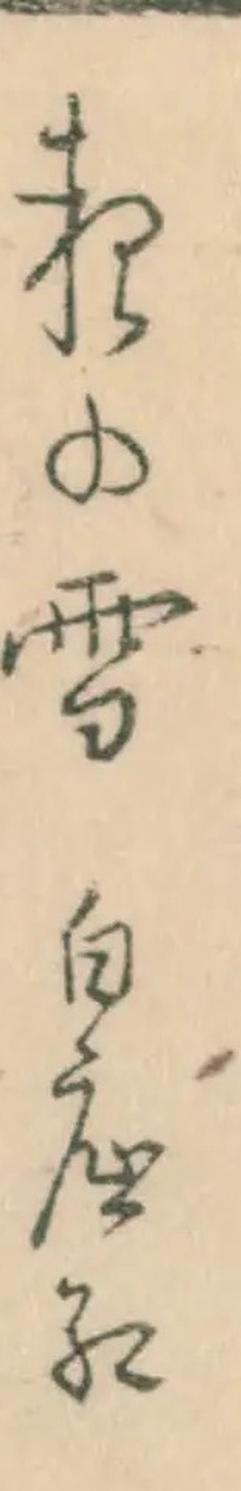軒の雪白唐紅
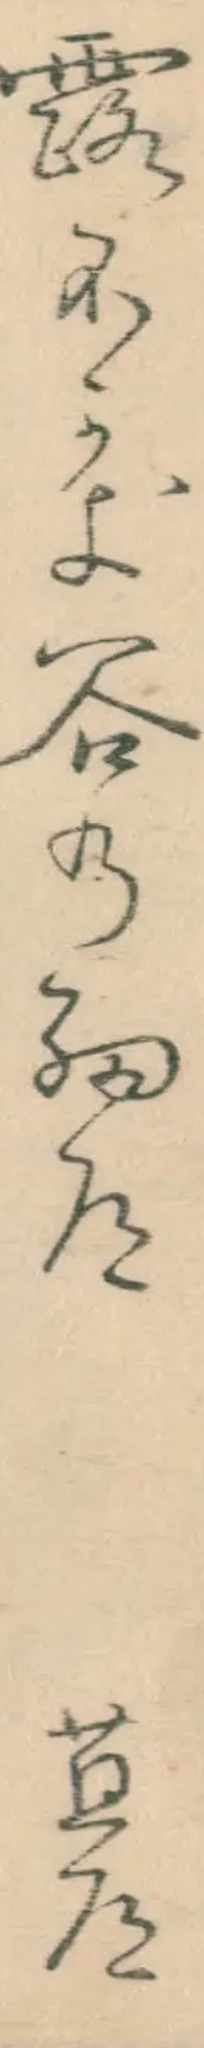露ふかき谷の細道草道
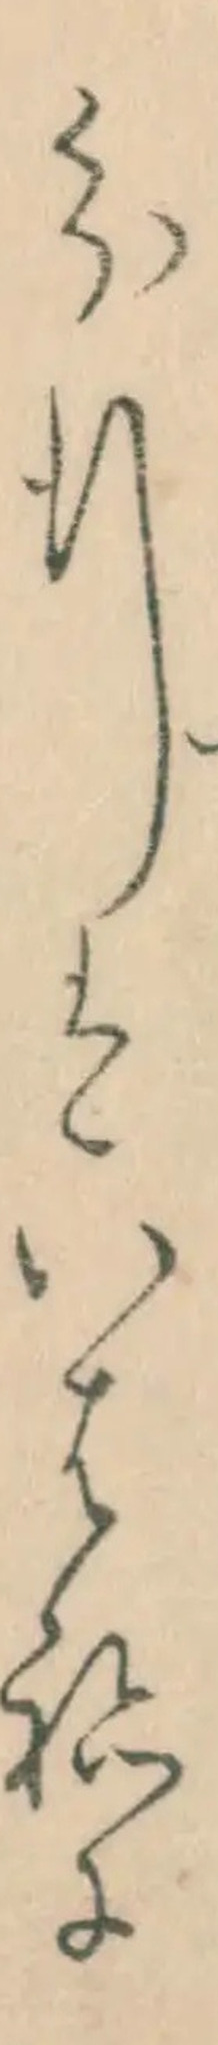分行はいはねに
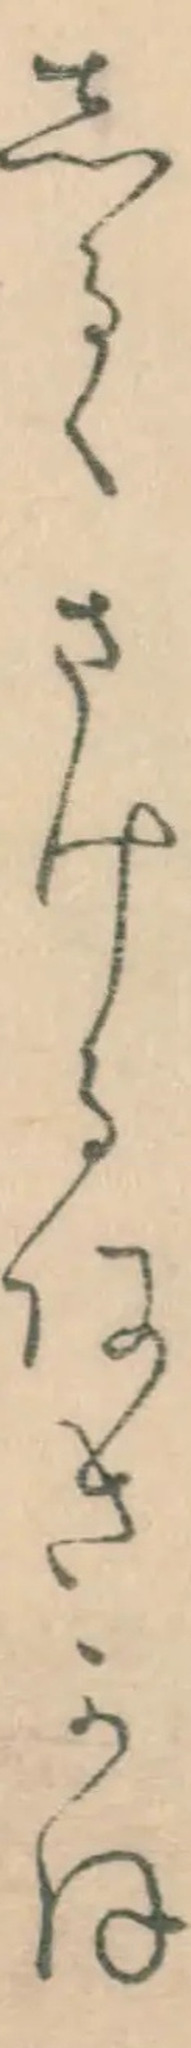しるくさけるあさかほ

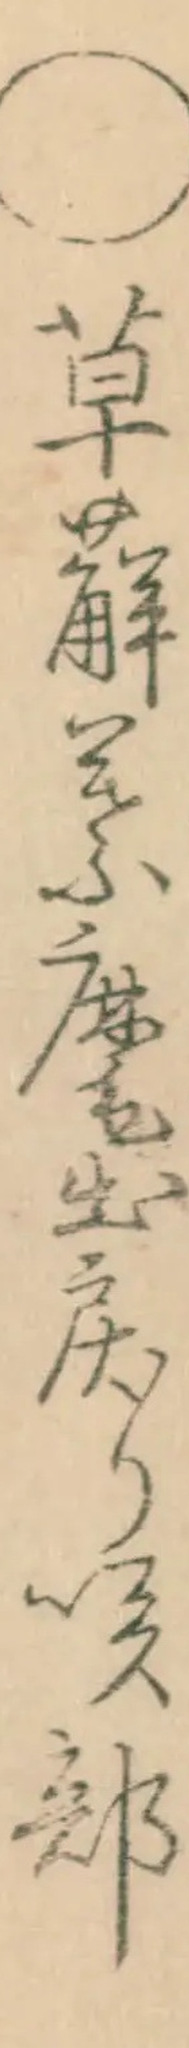○草蘚葉塵出戻り咲部
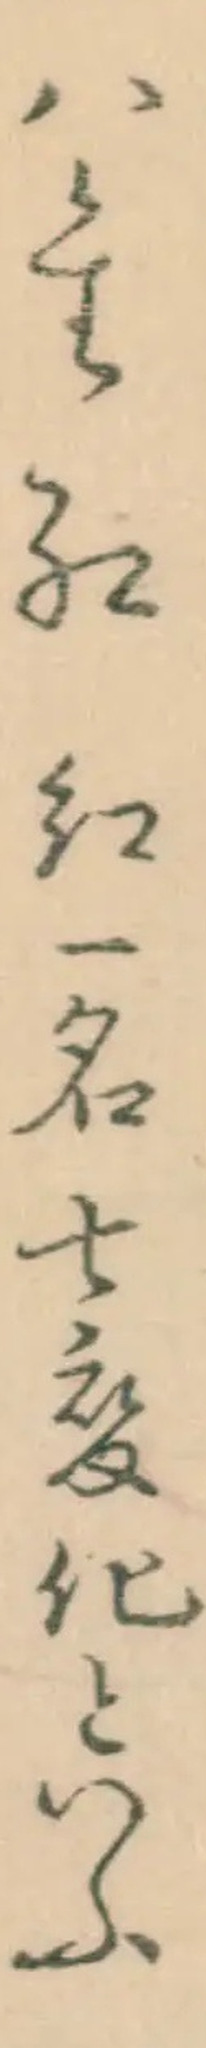八重紅紅一名七変化といふ
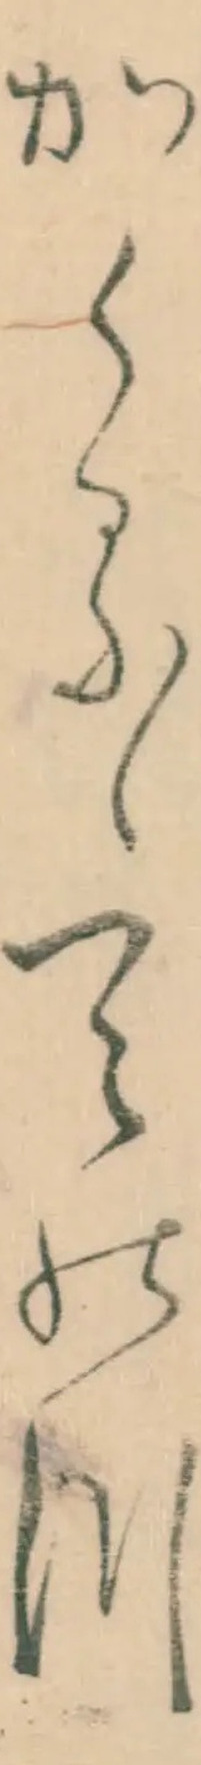かくるゝ天の川
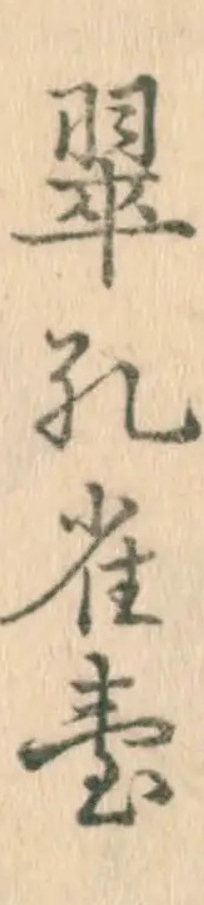翠孔雀壺

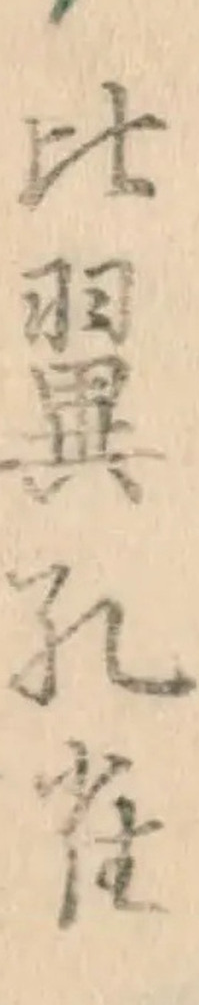比翼孔雀
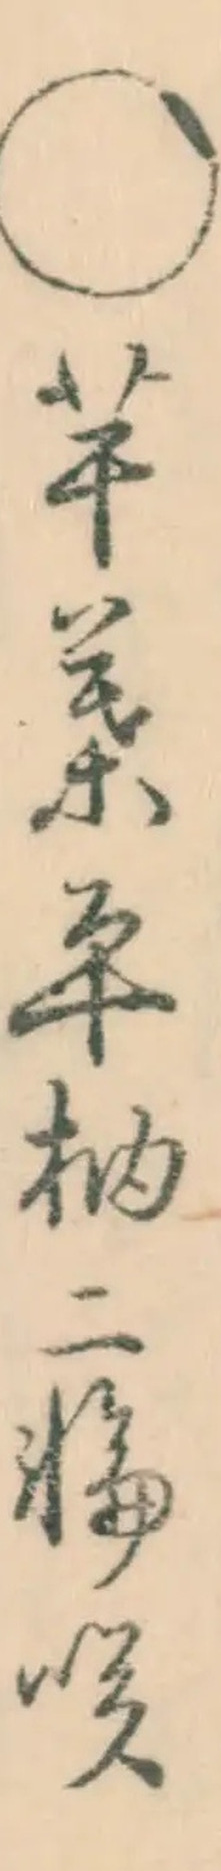○芋葉平江柄二輪咲
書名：花壇朝顔通 2巻. [2]
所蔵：国立国会図書館 National Diet Library, JAPAN
